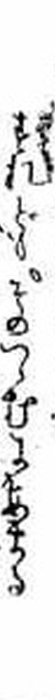すれどもそのつゝむにあまる
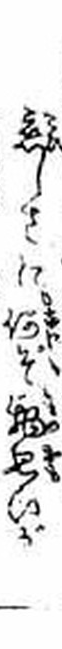恋しさに何ぞ物思ひが
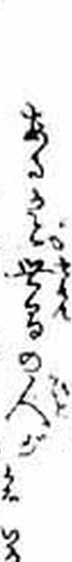あるかと世間の人が
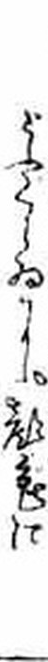とふくらゐに顔色に
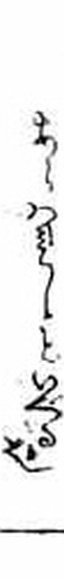あらはれしといへる也
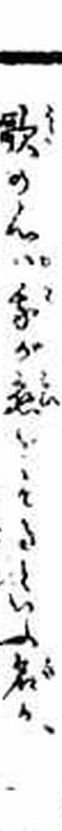歌の心はわが恋をもるといふ名が
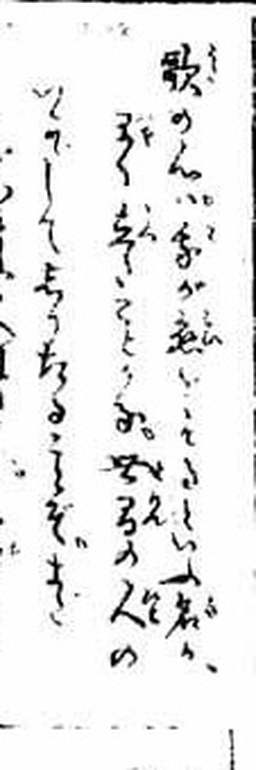早く立たことかな世間の人の壬生
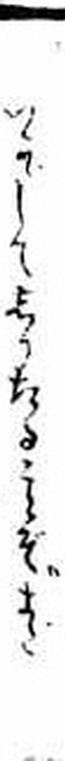いかゞしてしりたることぞまた
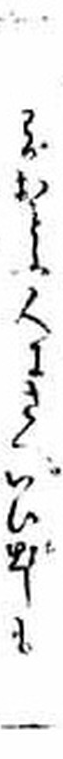わがおもふ人にさへいひ出しも忠
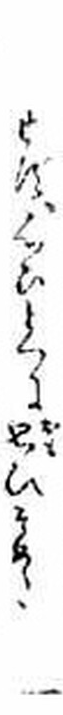せず心ひとつに思ひそめた
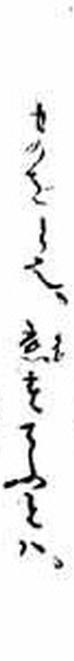ものをと也恋すてふとは
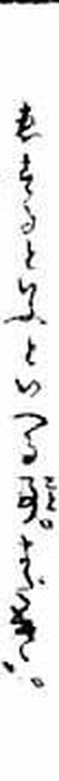恋するといふといへる事まだきは見
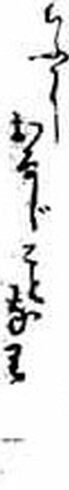おなじことなり

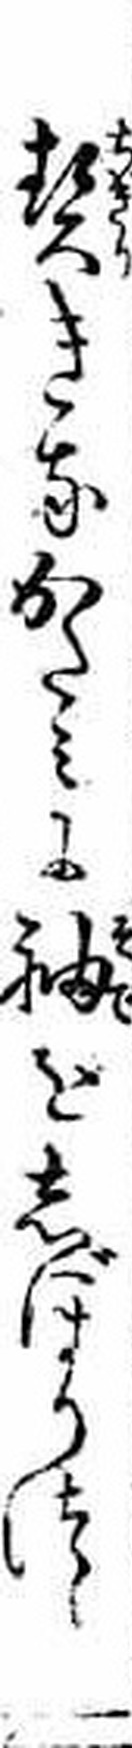契りきなかたみに袖をしぼりつゝ
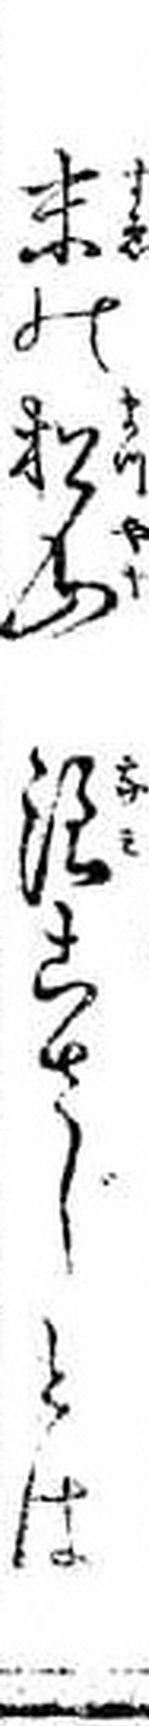末の松山波こさじとは
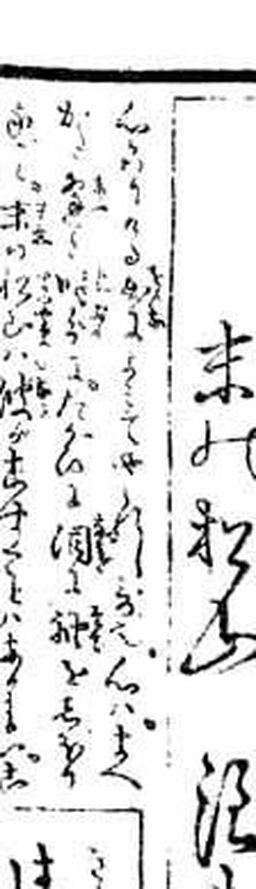心かはれる女によみてやられし哥也こころ心はまへ
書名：小倉百人一首
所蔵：東京学芸大学教育コンテンツアーカイブ
